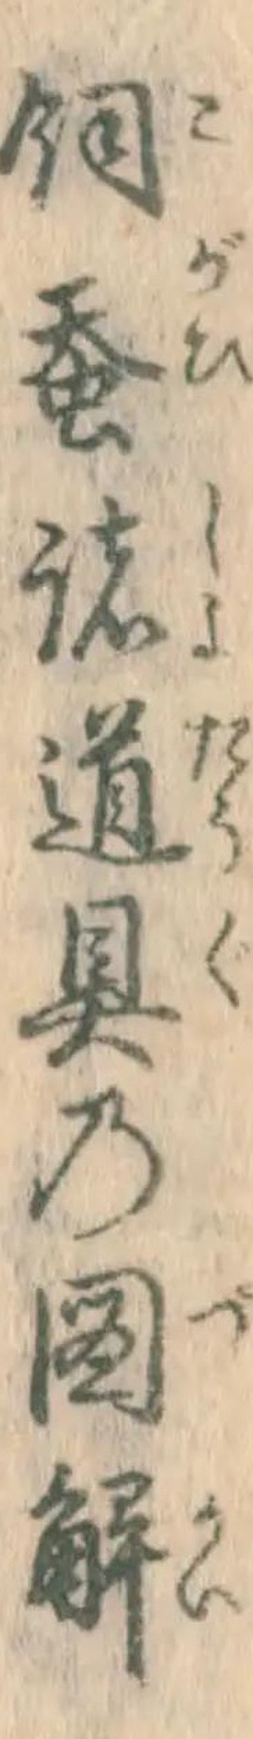飼蚕諸道具の図解
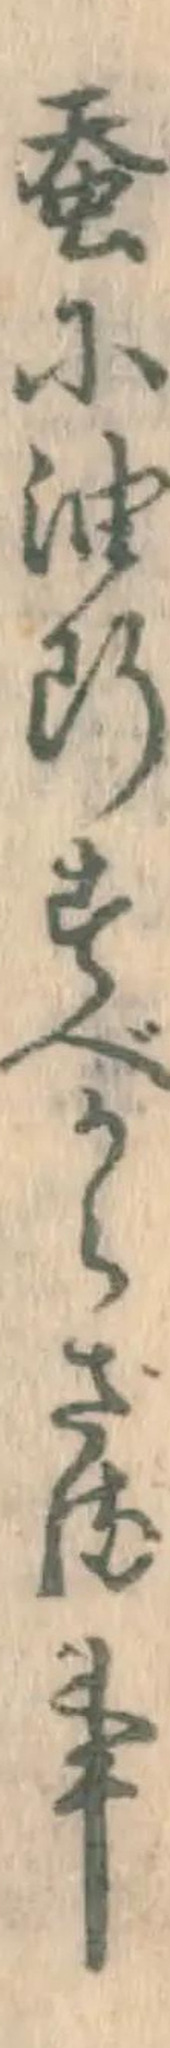蚕に油断すべからざる事
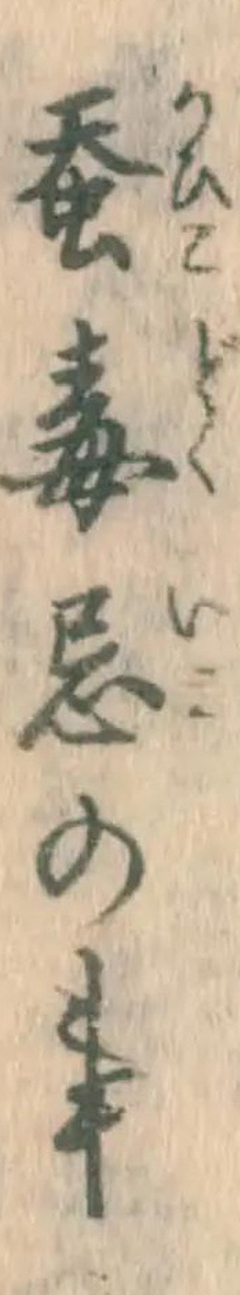蚕毒忌の事
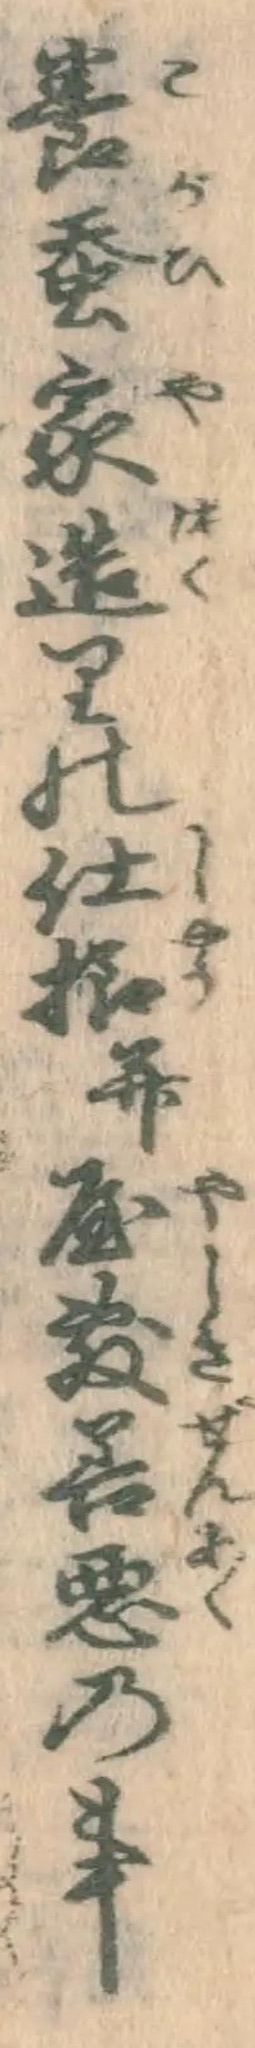養蚕家造りの仕様并屋敷善悪の事
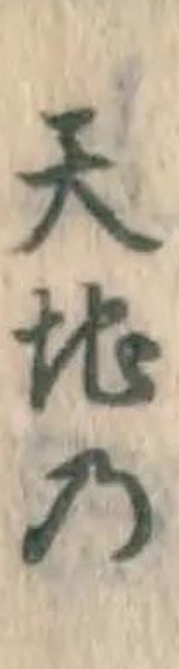天地の
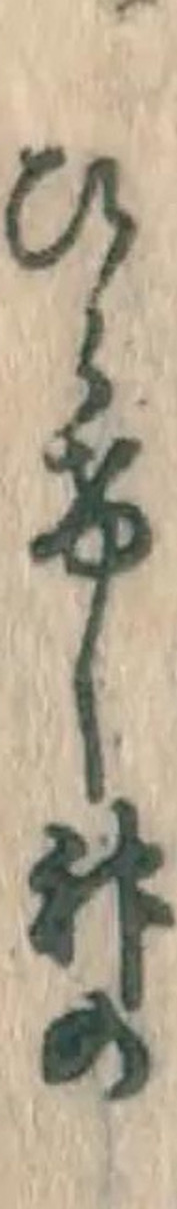ひらけし神の
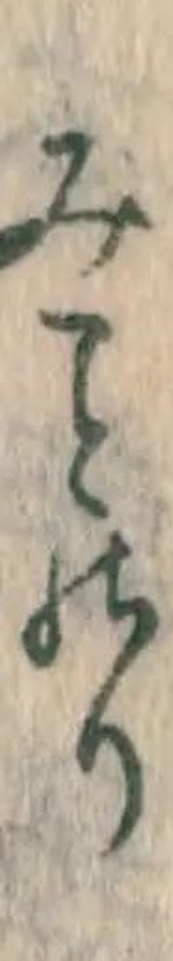みことのり
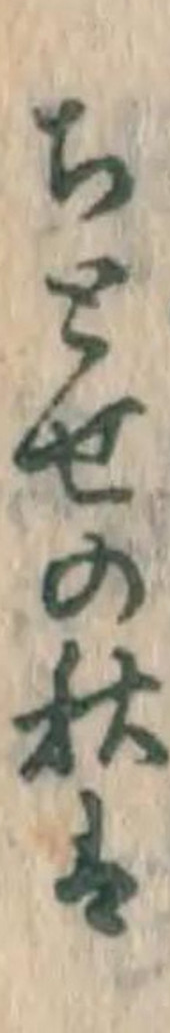ちとせの秋は
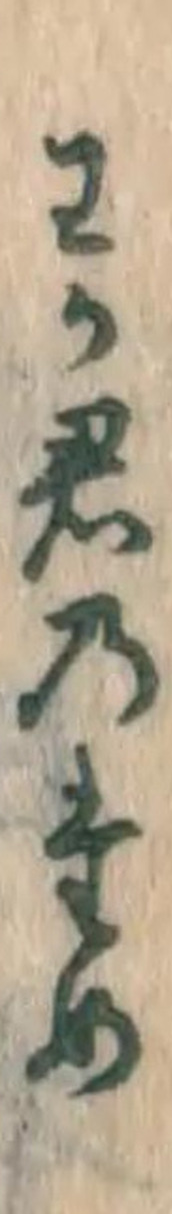わか君のため

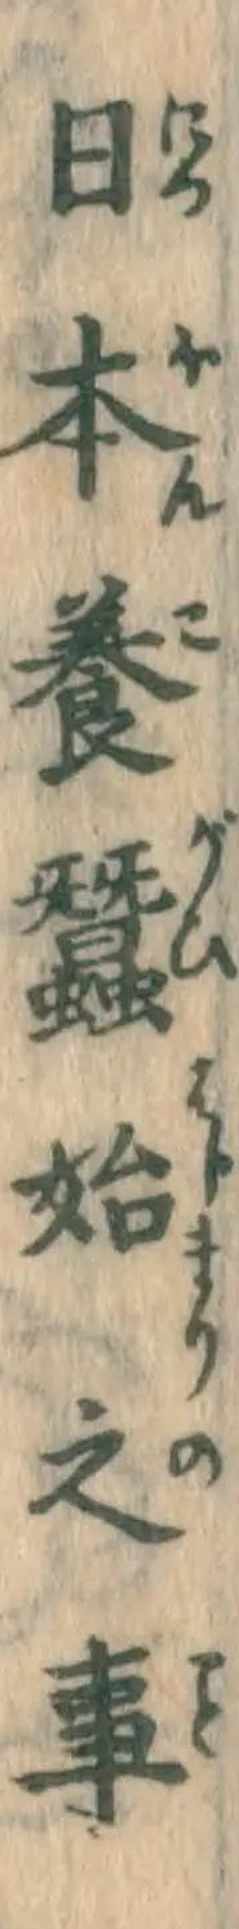日本養蚕始之事
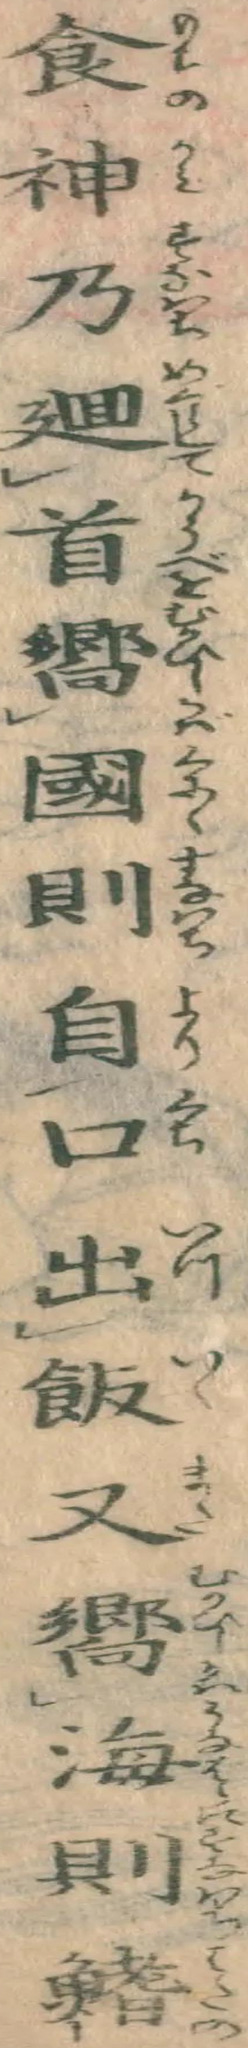食神乃廻首嚮国則自口出飯又嚮海則鰭-
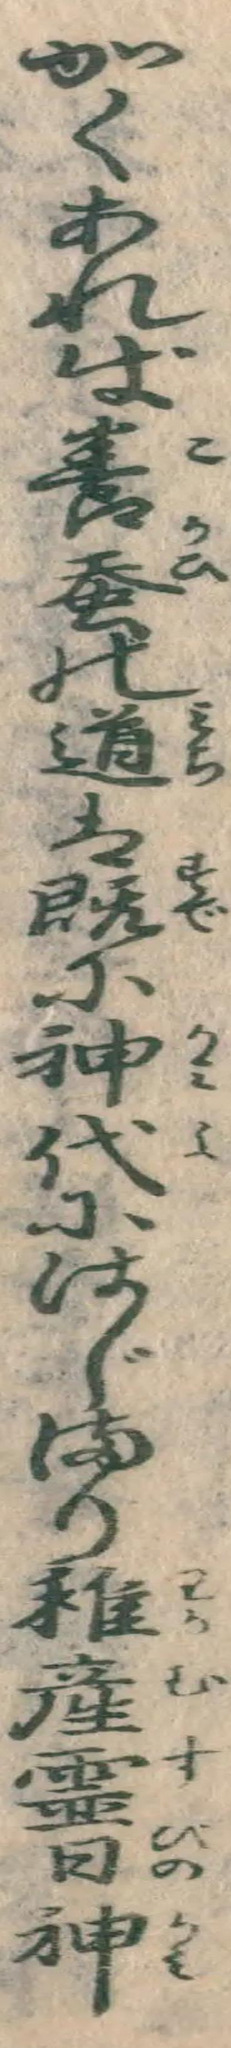かくあれば養蚕の道は既に神代にはじまり稚産霊日神
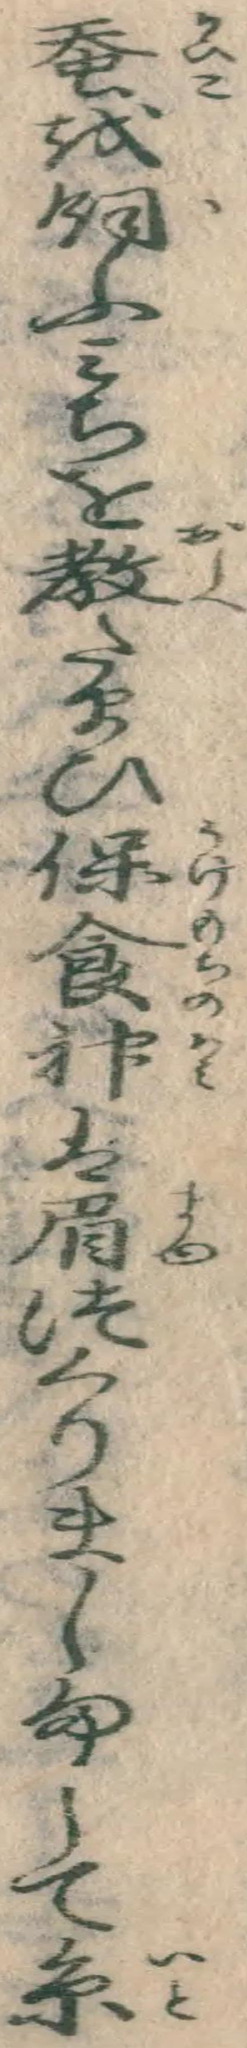蚕を飼ふみちを教たまひ保食神は眉つくりましまして糸
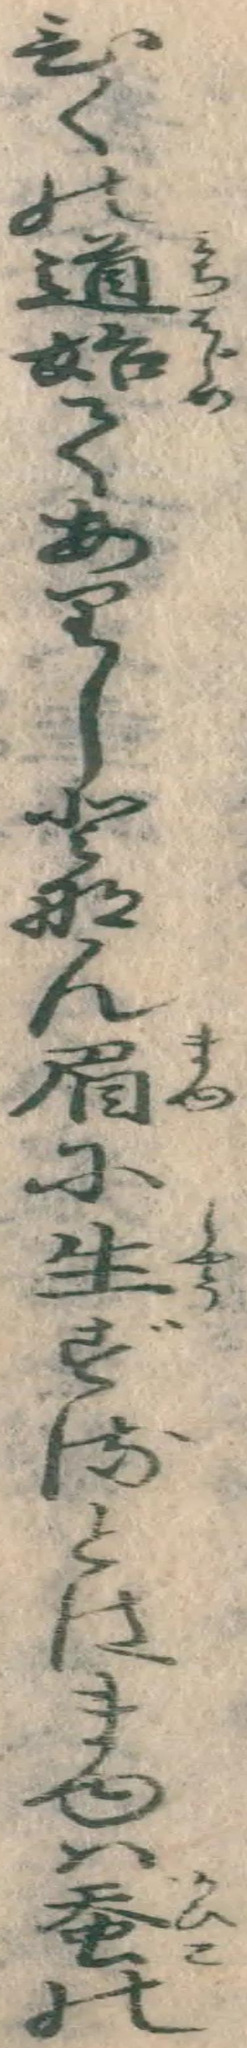ひくの道始てありしとなん眉に生ずるとはまゆは蚕の
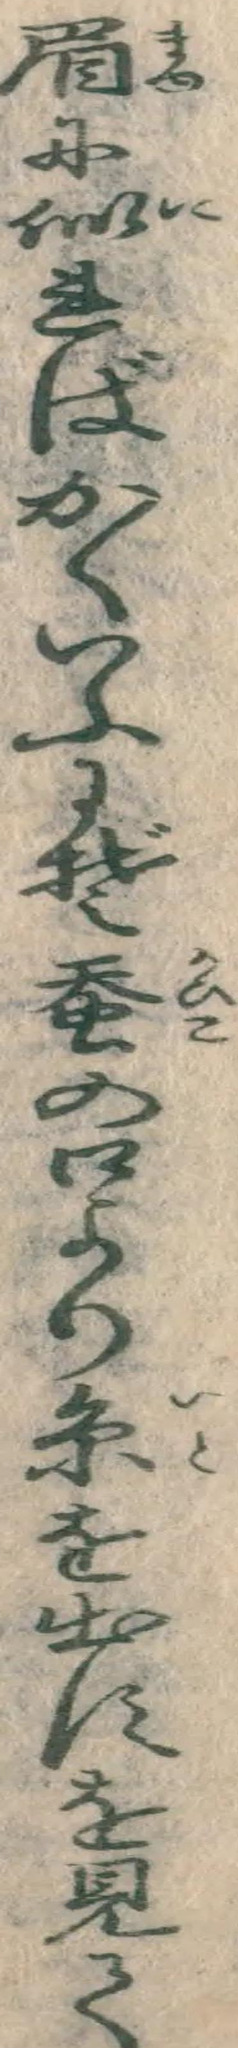眉に似ればかくいふにぞ蚕の口より糸を出すを見て
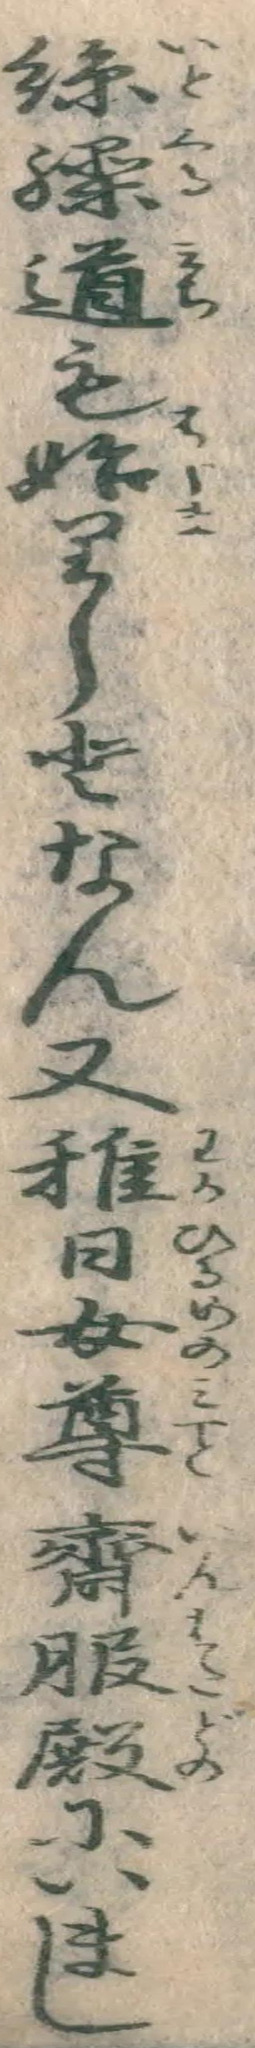糸繰道も始りしとなん又稚日女尊斎服殿にいまし
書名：養蚕秘録 3巻. [1]
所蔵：国立国会図書館 National Diet Library, JAPAN
